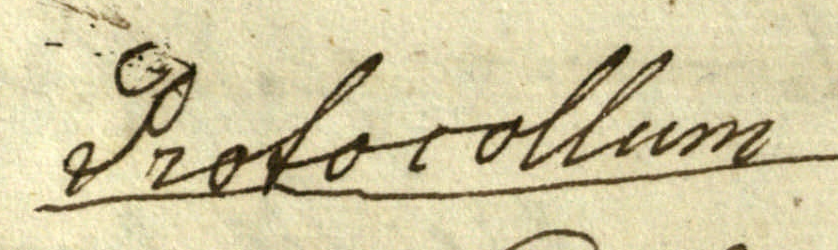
Protocollum
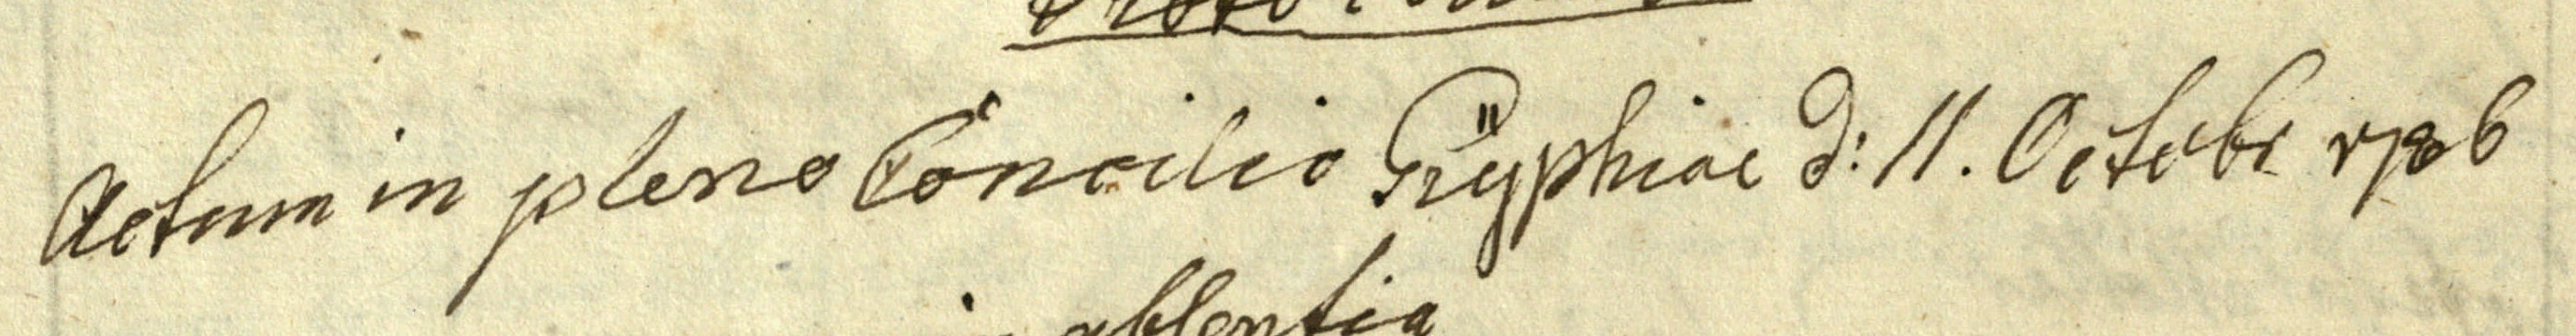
Actum in pleno Concilio Grÿphiae d. 11. Octobr 1786
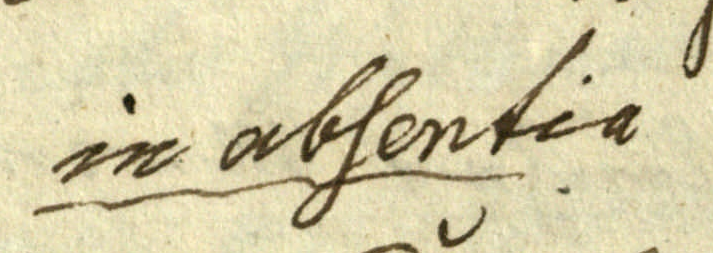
in absentia
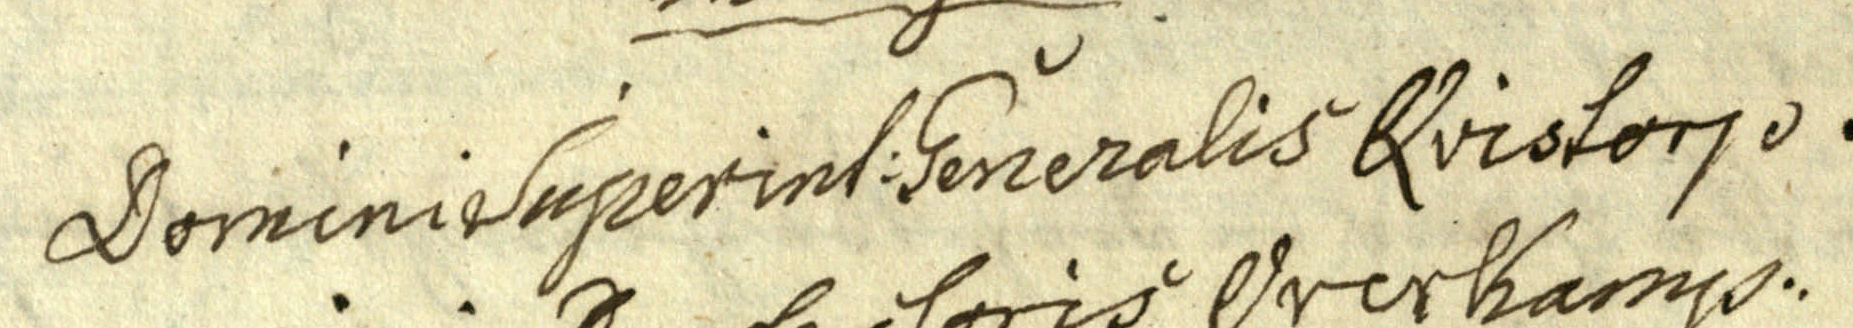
Domini Superint Generalis Quistorp.
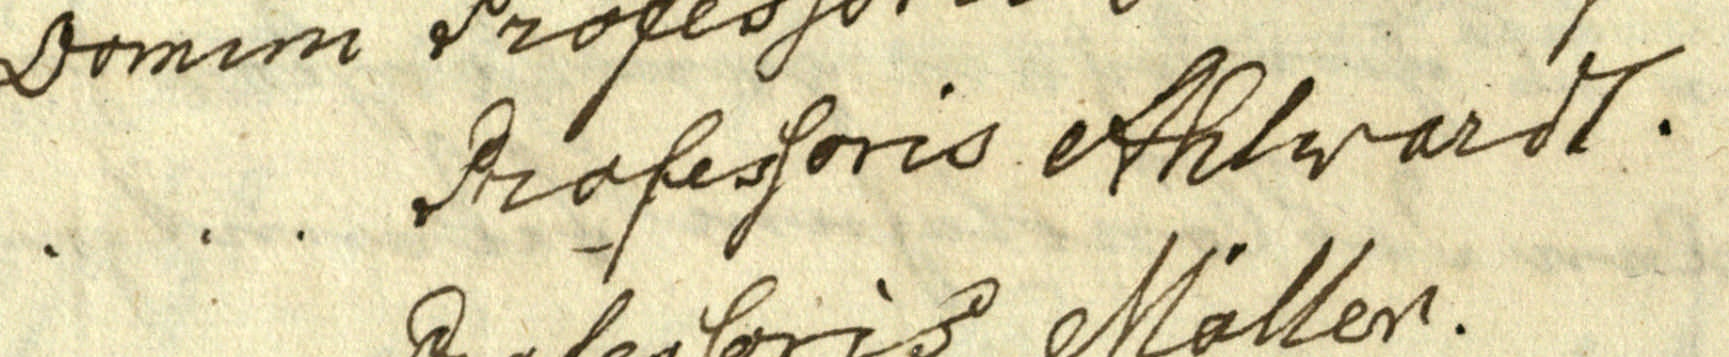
Professoris Ahlwardt.
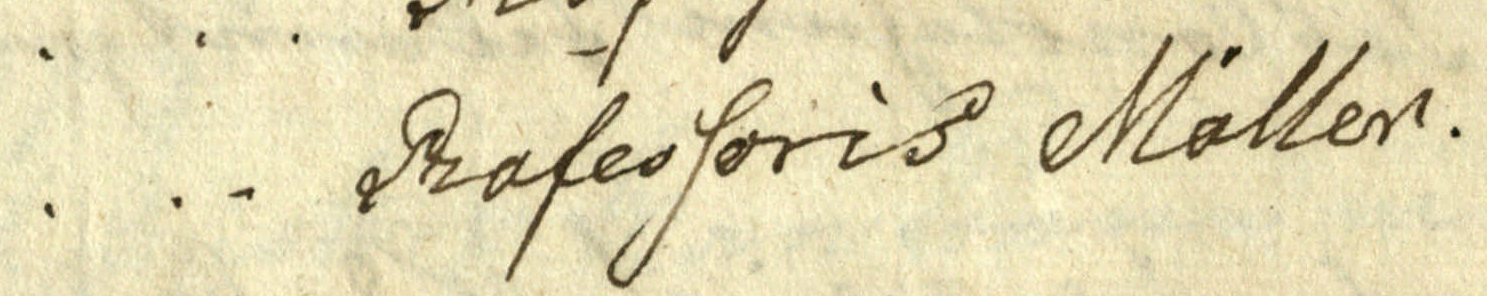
Professoris Möller.
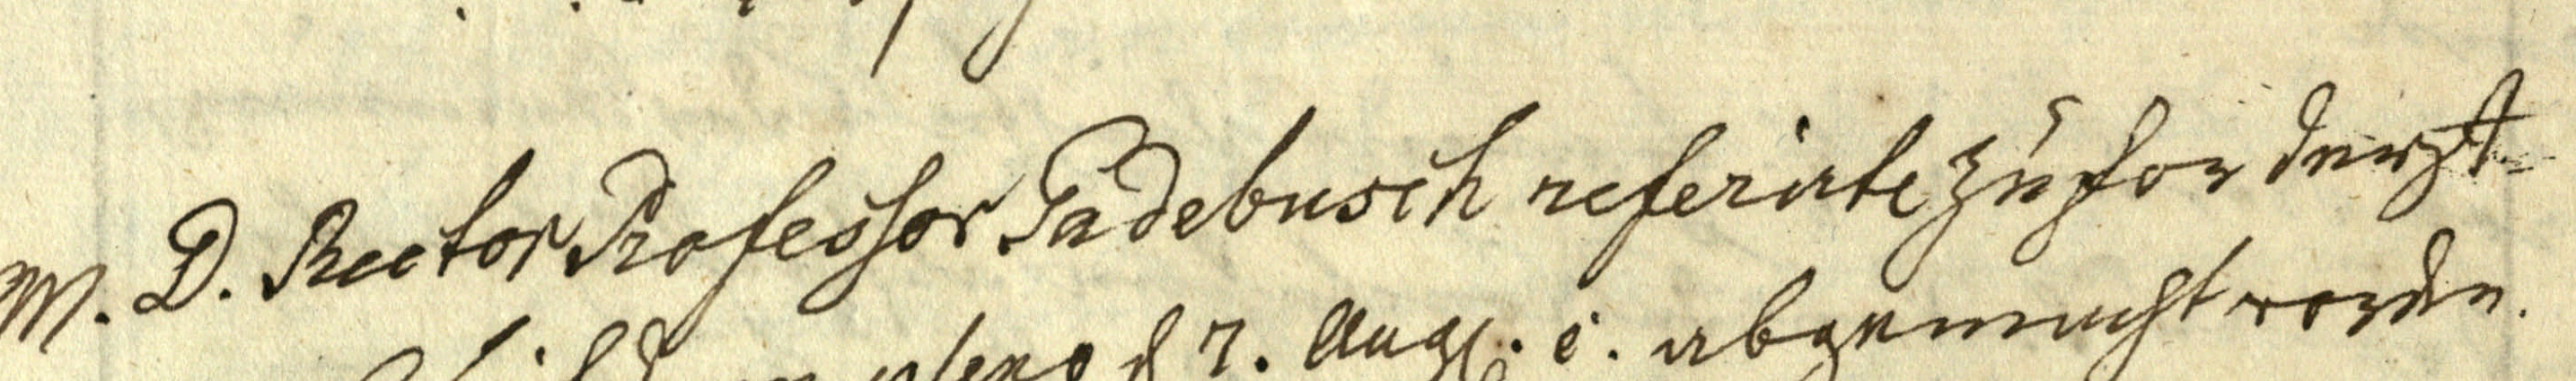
M. D. Rector Professor Gadebusch referirte zuforderst
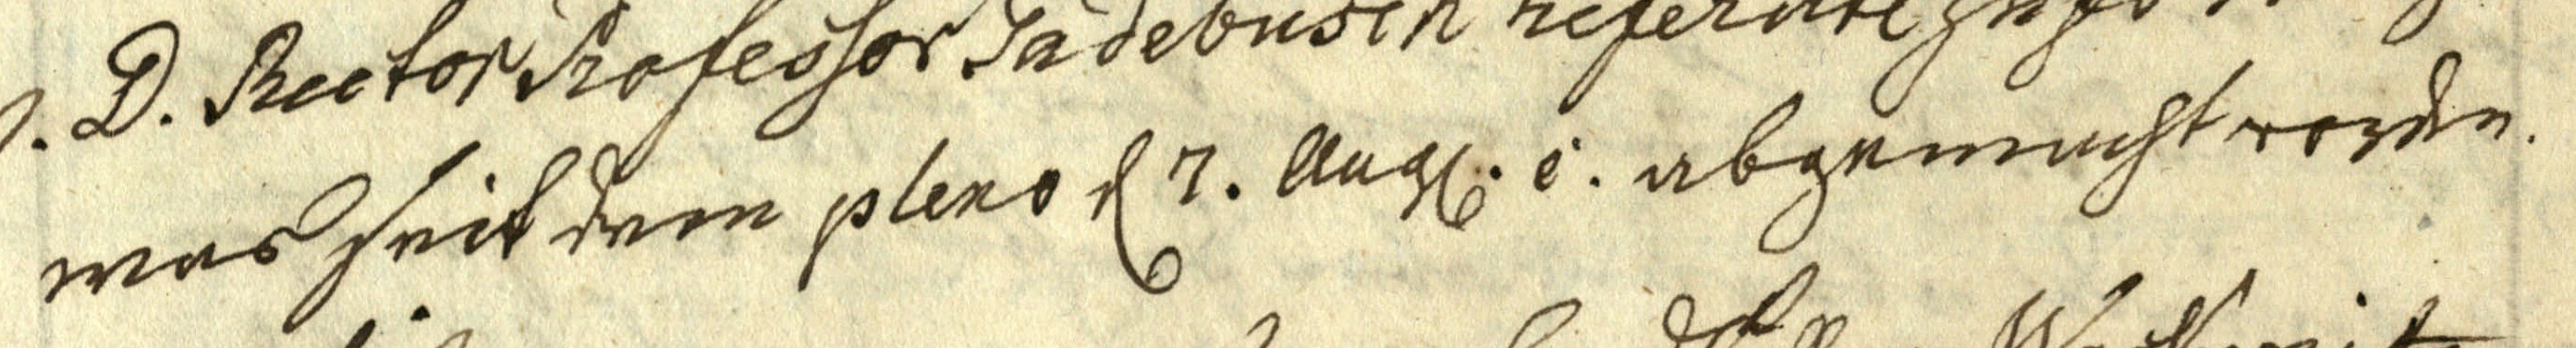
was seit dem pleno d 7. Aug. abgemacht worden.
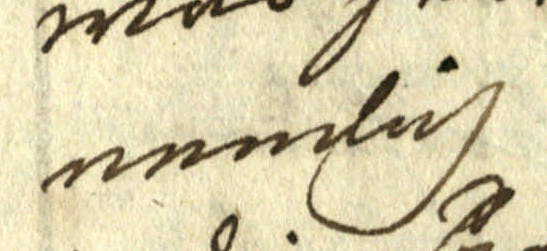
nemlich
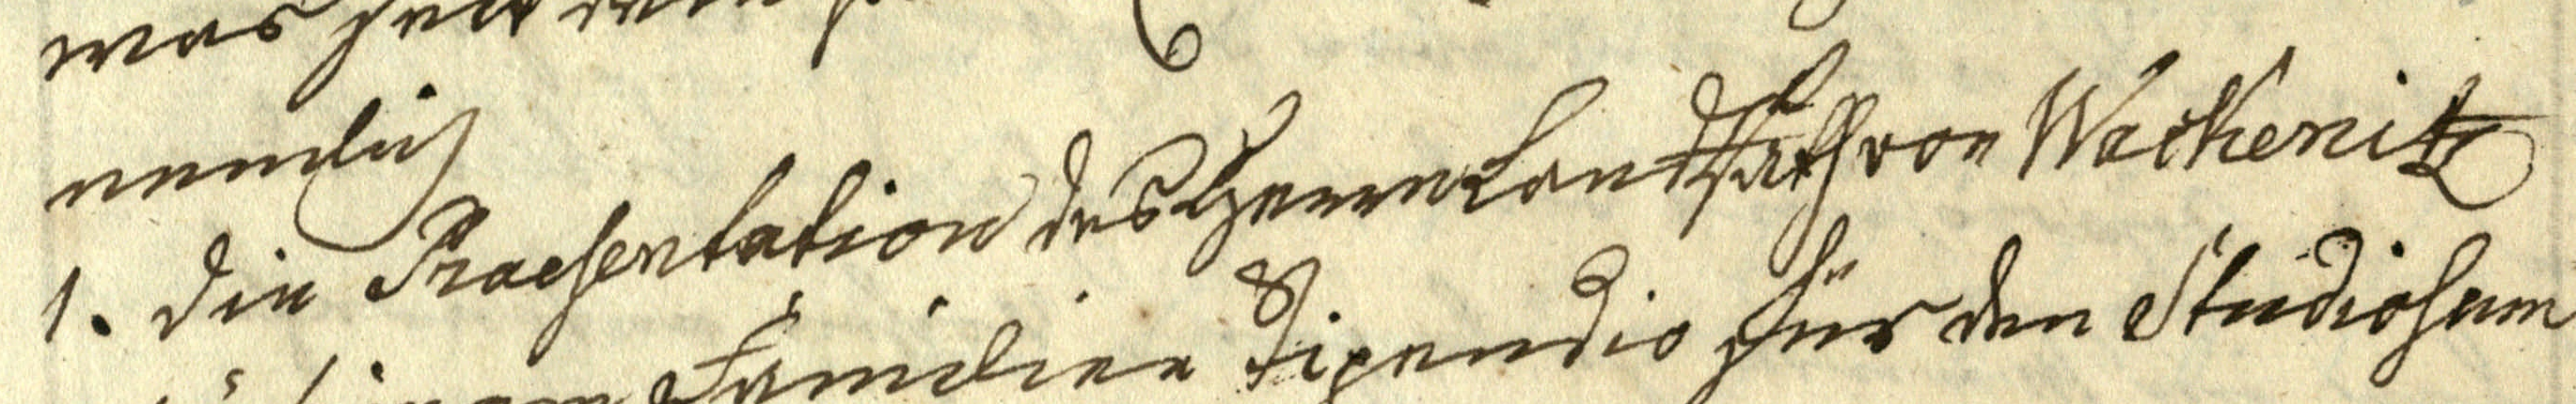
1. die Praesentation des Herrn LandRath von Wackenitz
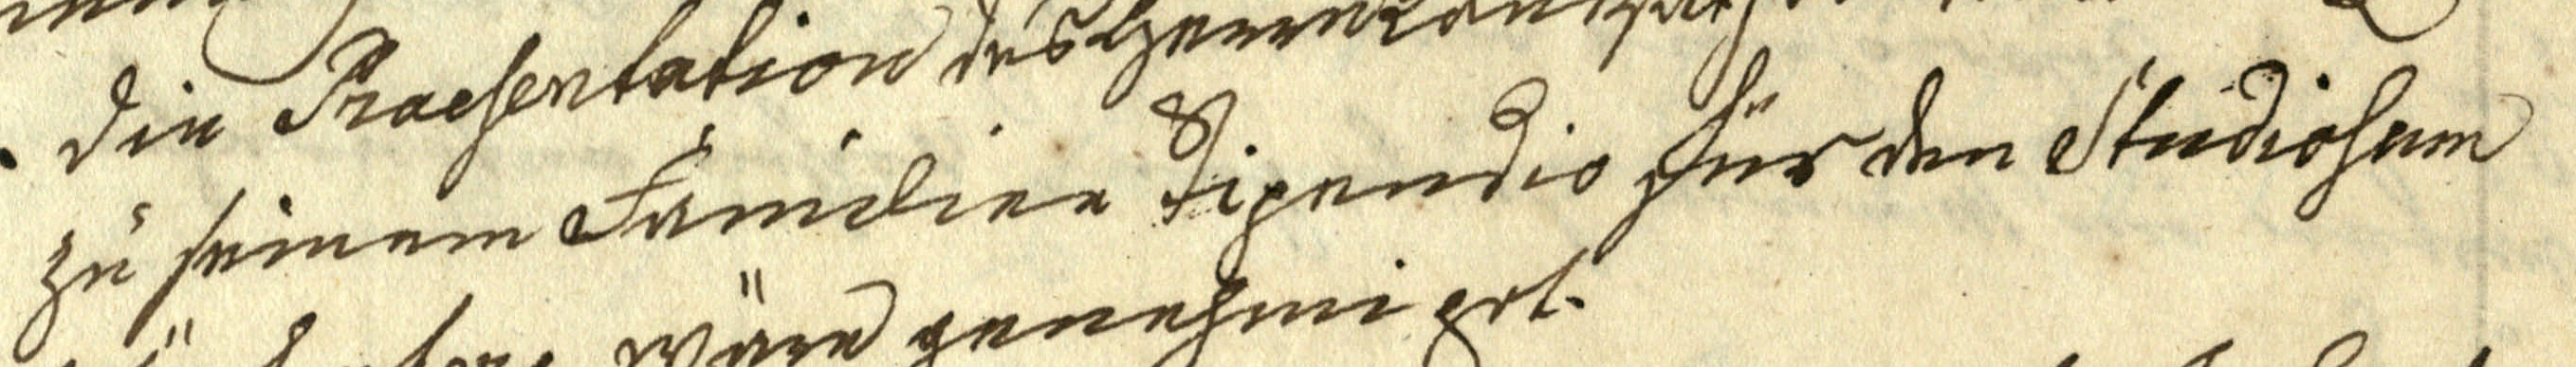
zu seinen Familien Stipendio für den Studiosum
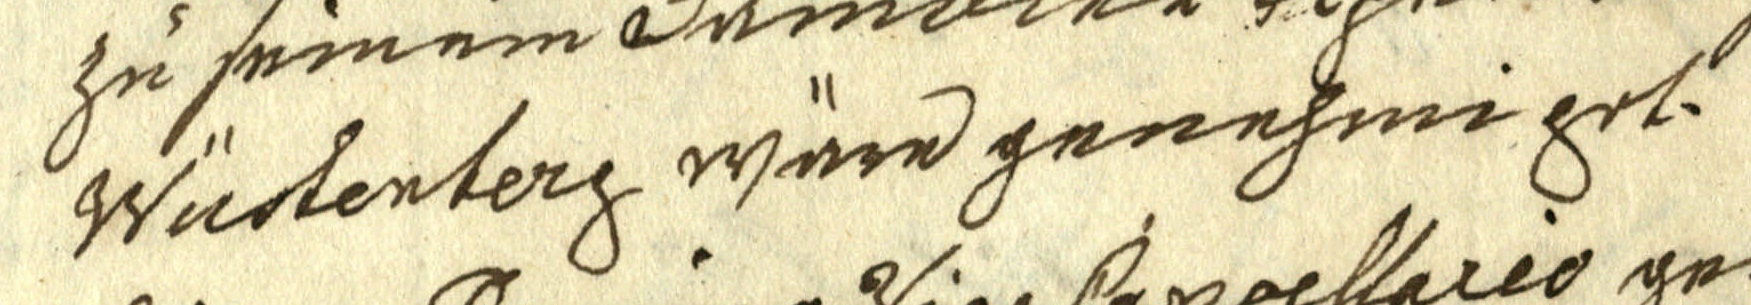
Wüstenberg wäre genehmiget.
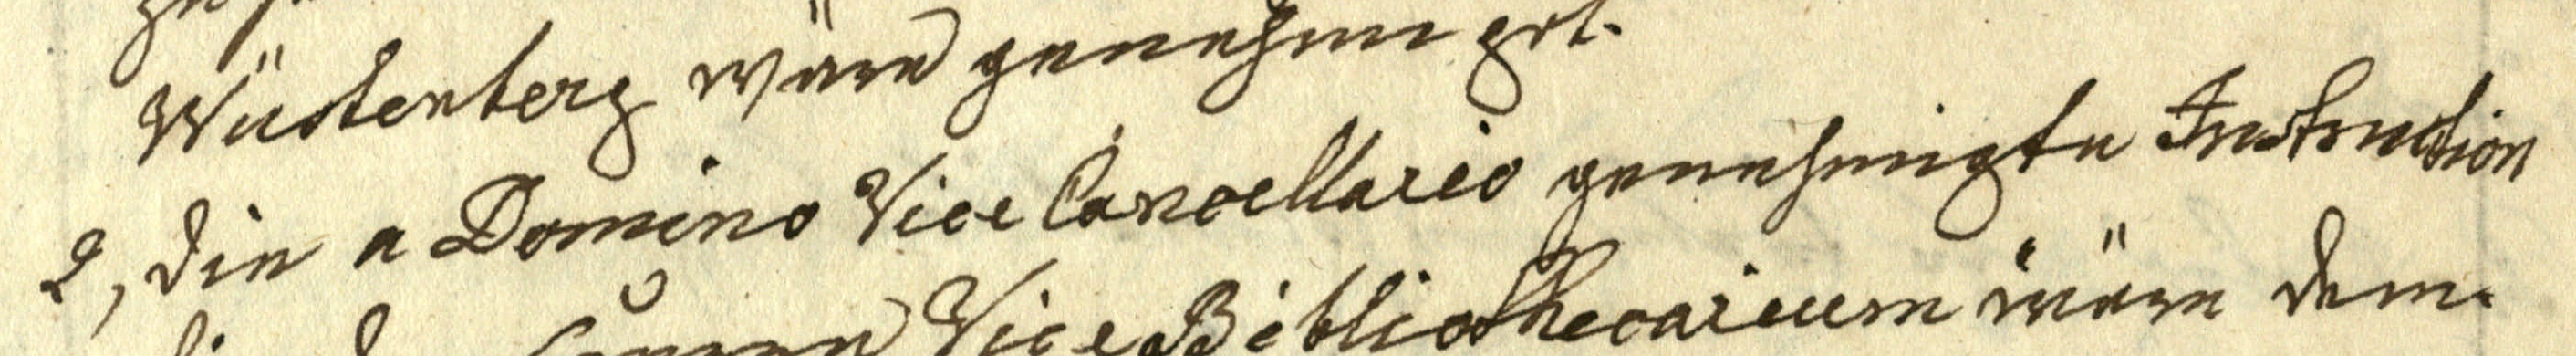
2, die a Domino Vice Cancellario genehmigten Instruction
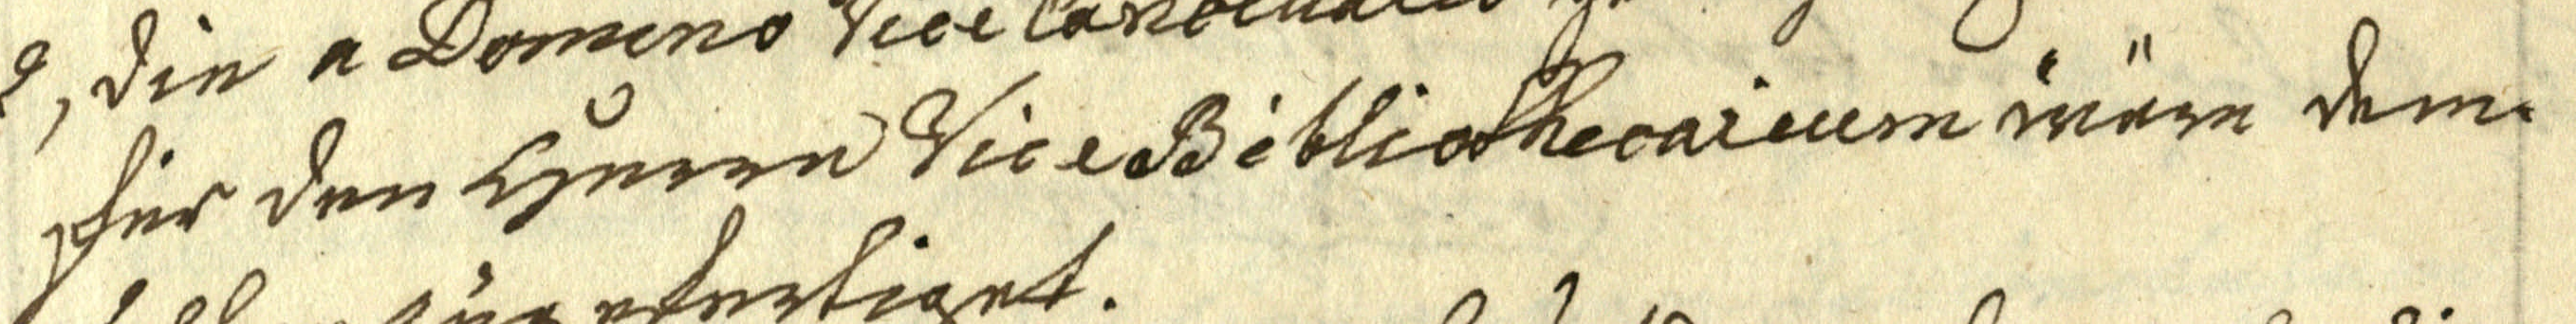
für den Herrn Vice Bibliothecarium wäre dem¬
